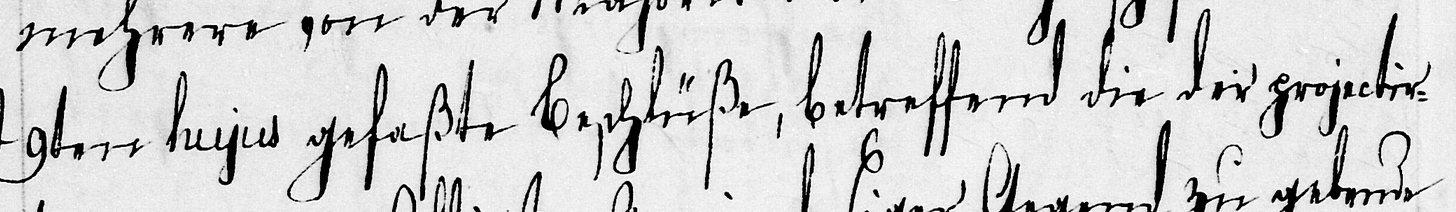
9ten hujus gefaßte Beschlüße, betreffend die der projecti¬
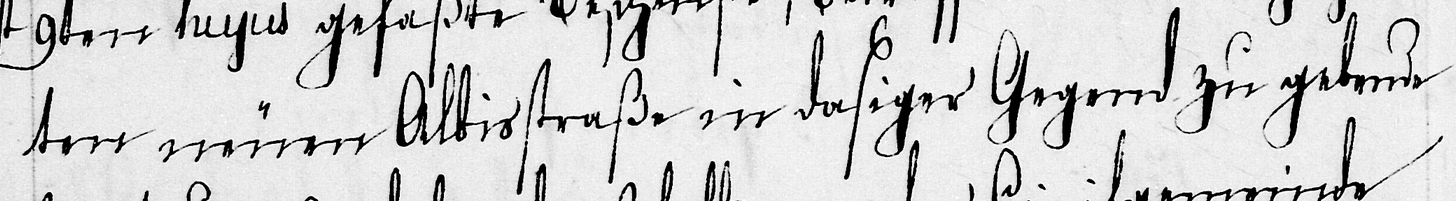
rten neuen Albisstraße in dasiger Gegend zu gebende
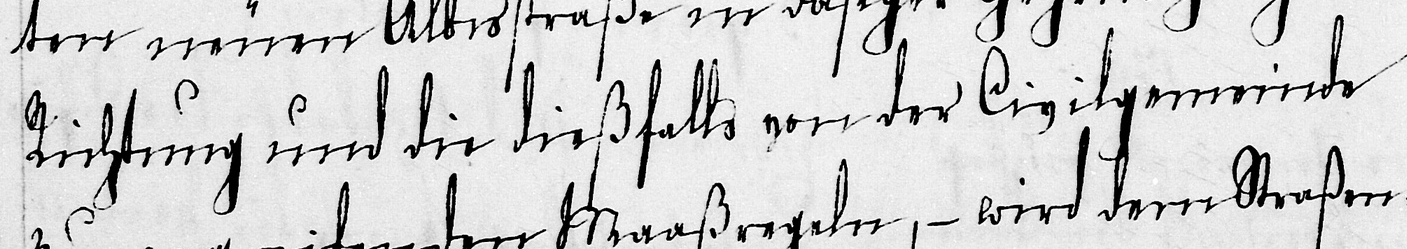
Richtung und die dießfalls von der Civilgemeinde
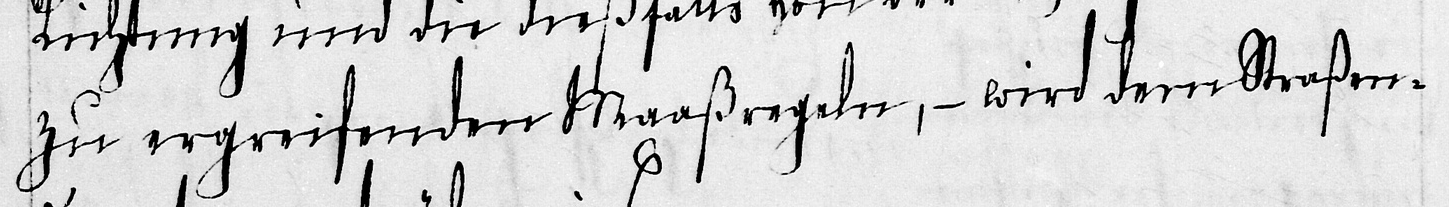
zu ergreifenden Maaßregeln, – wird dem Straße¬
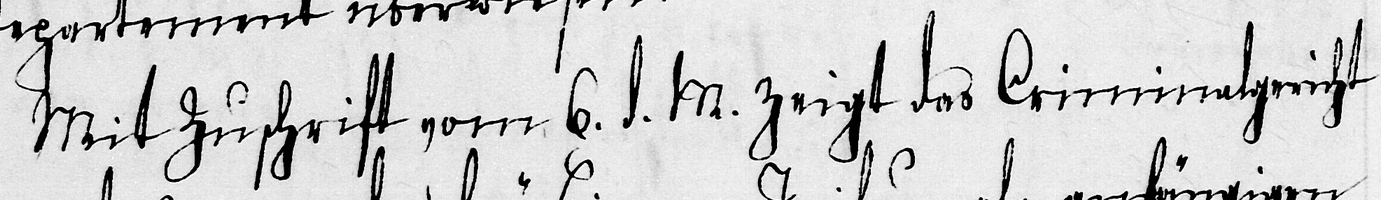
Mit Zuschrift vom 6. d. M. zeigt das Criminalgericht
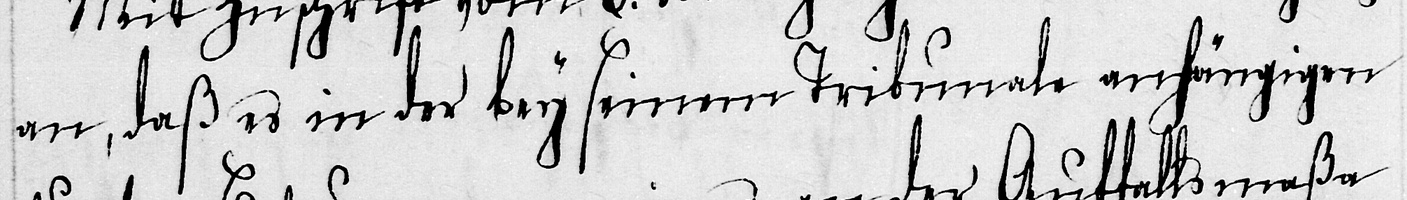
an, daß es in der bey seinem Tribunale anhängigen
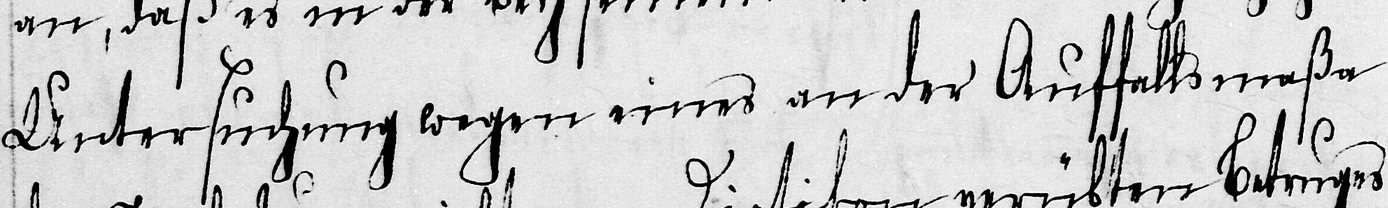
Untersuchung wegen eines an der Auffallsmaßa
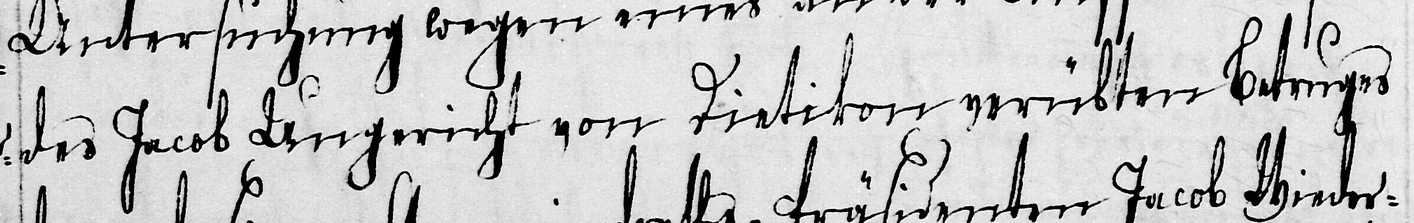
des Jacob Ungericht von Dietikon verübten Betruges
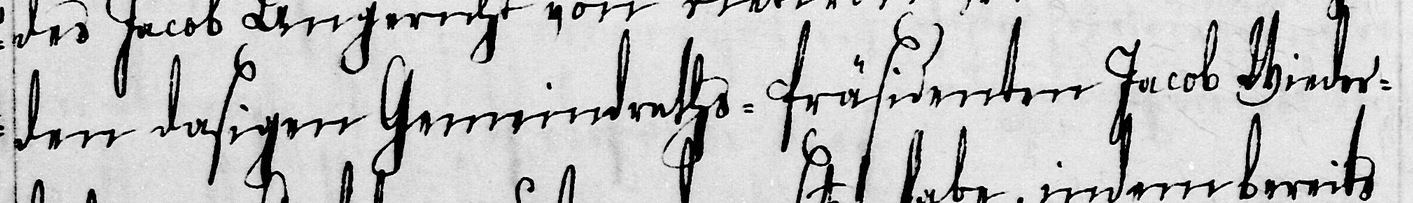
den dasigen Gemeindraths-Präsidenten Jacob Wieder¬
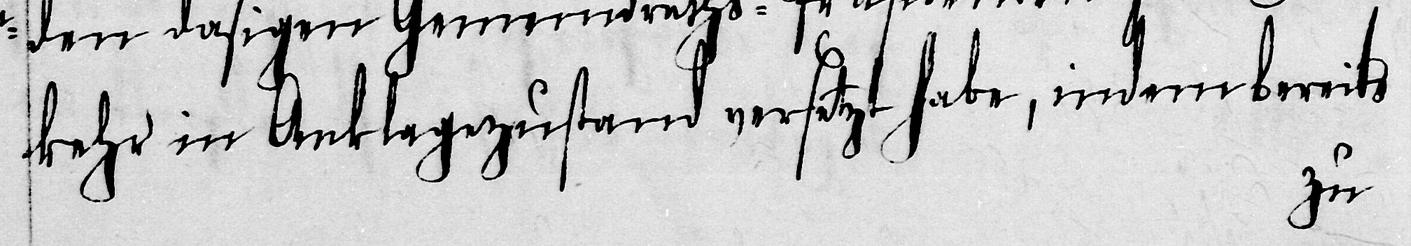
kehr in Anklagezustand versetzt habe, indem bereits,
